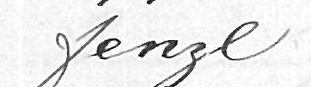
Fenzl
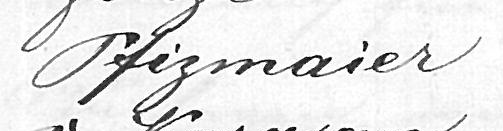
Pfizmaier
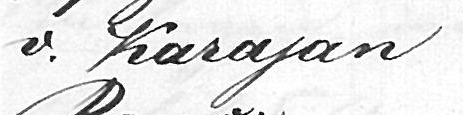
v. Karajan
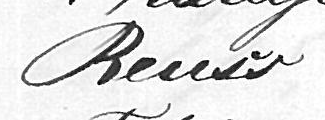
Reuss
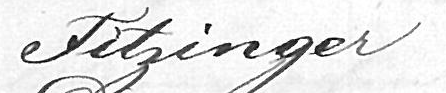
Fitzinger
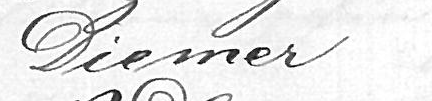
Diemer
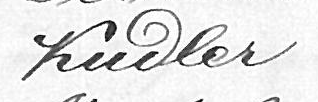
Kudler
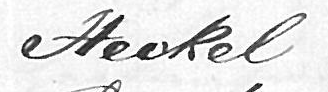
Heckel
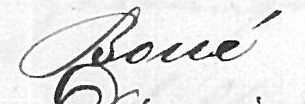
Boué
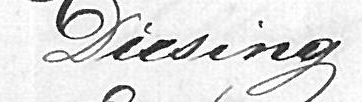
Diesing
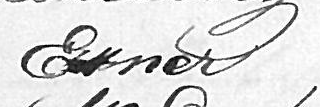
Exner
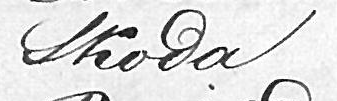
Skoda
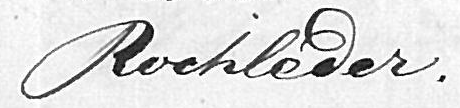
Rochleder
